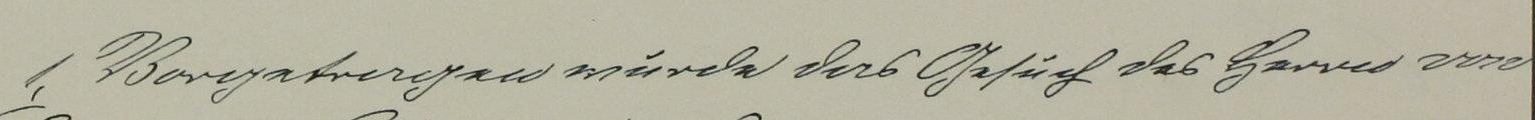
1. Vorgetragen wurde das Gesuch des Herrn von
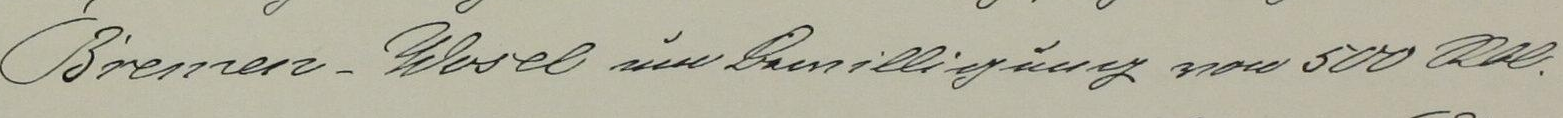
Bremen-Wosel um Bewilligung von 500 Rbl.
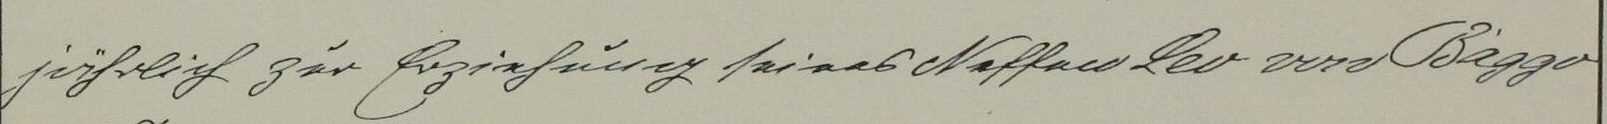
jährlich zur Erziehung seines Neffen Leo von Baggo
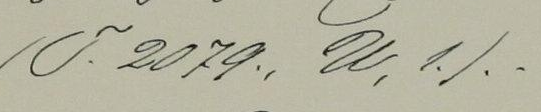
(T.2079., U.1).
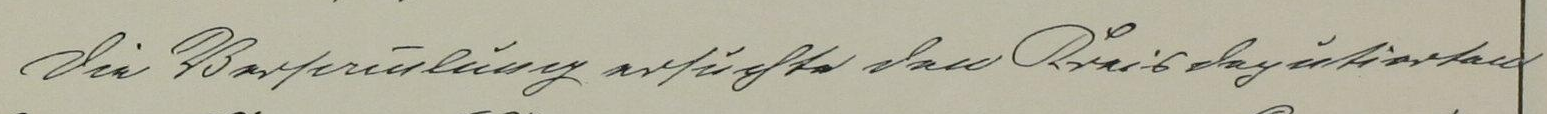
Die Versammlung ersuchte den Kreisdeputierten
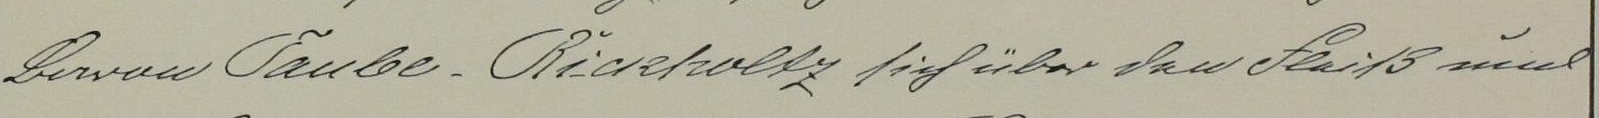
Baron Taube-Rickholtz, sich über den Fleiß und
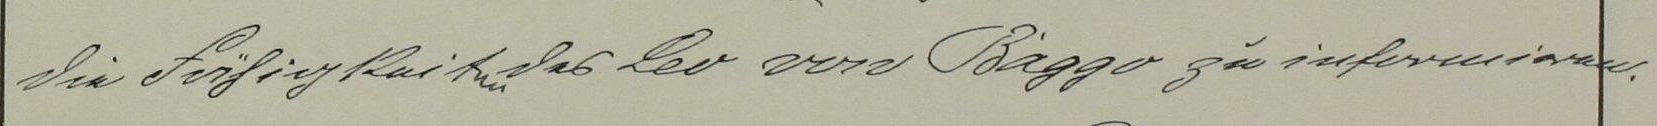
die Fähigkeiten des Leo von Baggo zu informieren.
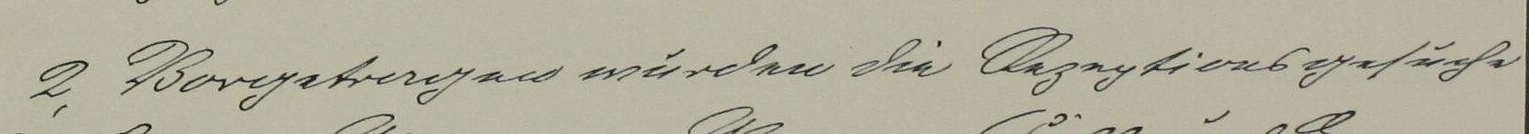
2. Vorgetragen wurden die Rezeptionsgesuche
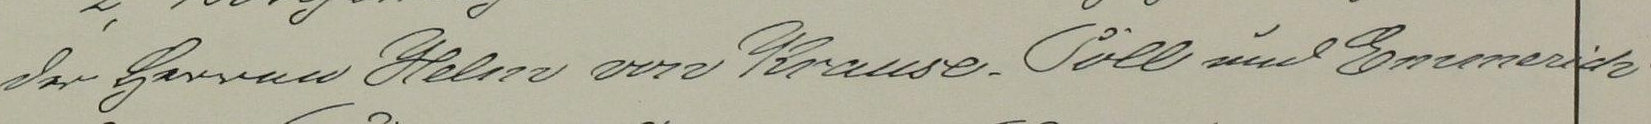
der Herren Helm von Krause-Poll und Emmerich
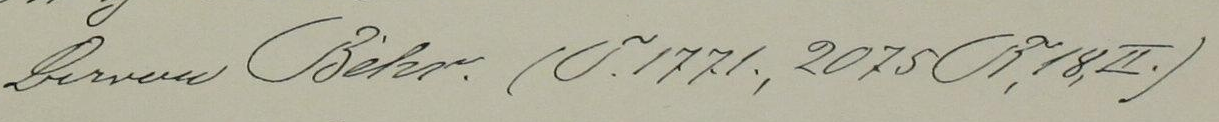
Baron Behr. (T.1771., 2075 R,18,II.)
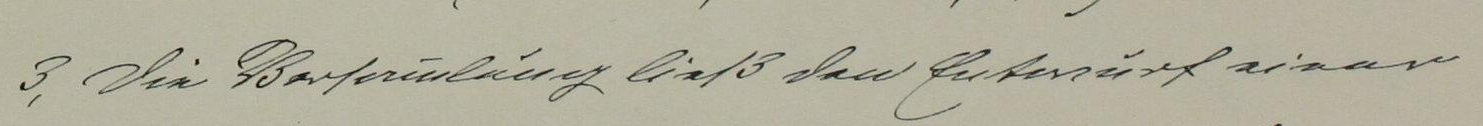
3. Die Versammlung ließ den Entwurf einer
